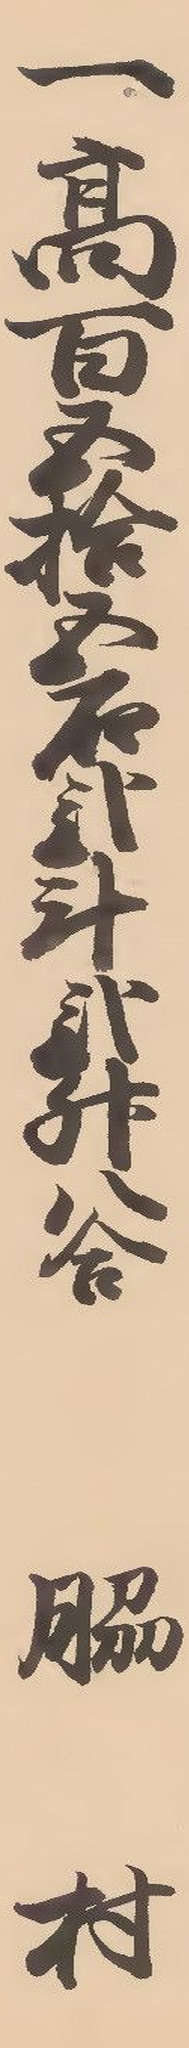一高百五拾五石弐斗弐升八合脇村
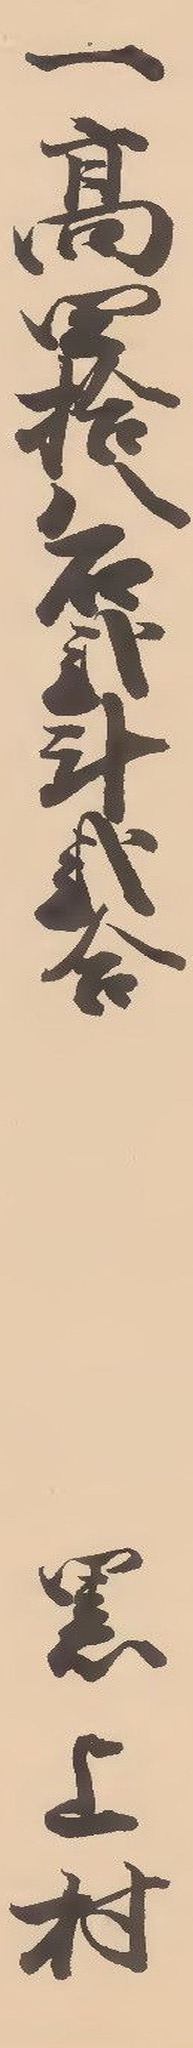一高四拾八石弐斗弐合黒上村
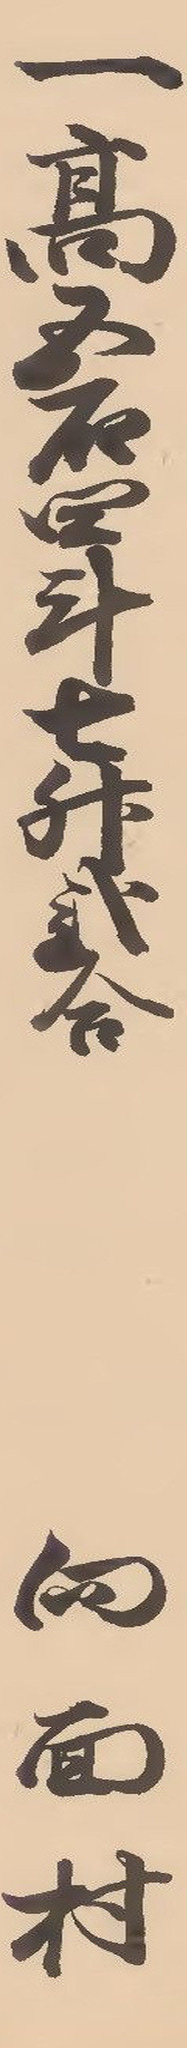一高五石四斗七升弐合向面村

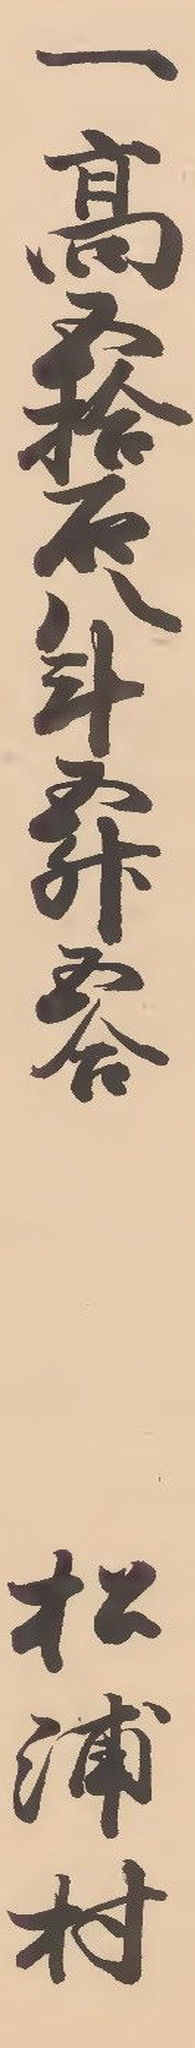一高五拾石八斗五升五合松浦村
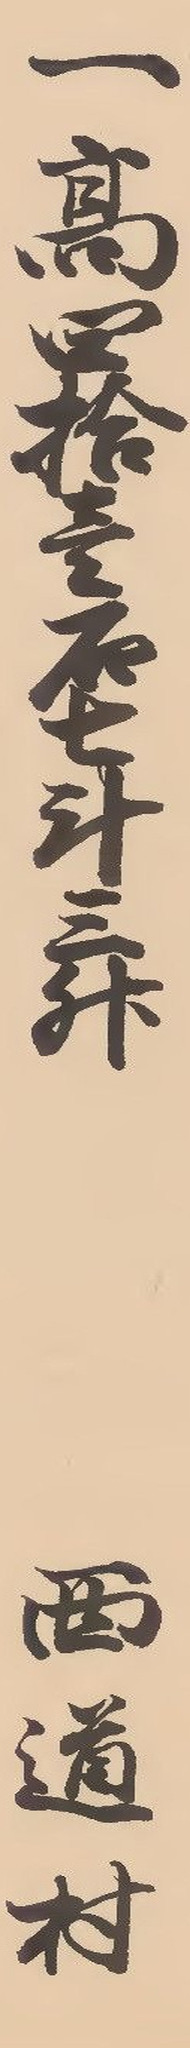一高四拾壱石七斗三升西道村
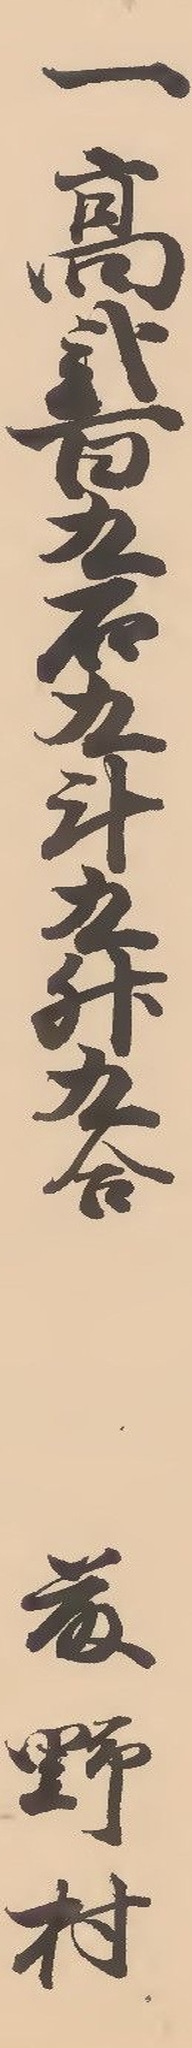一高弐百九石九斗九升九合藤野村
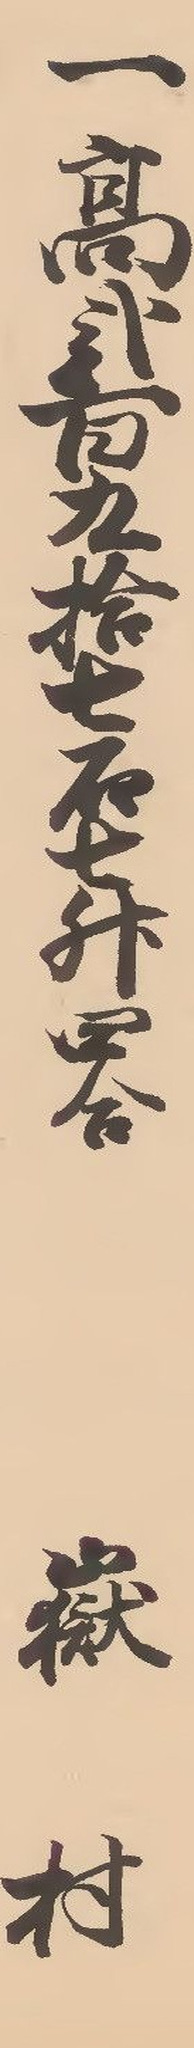一高弐百九拾七石七升四合嶽村
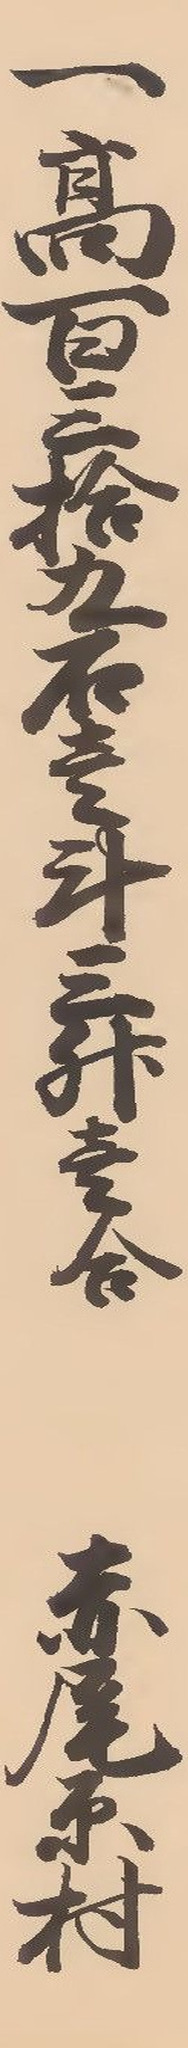一高百三拾九石壱斗三升壱合赤尾原村
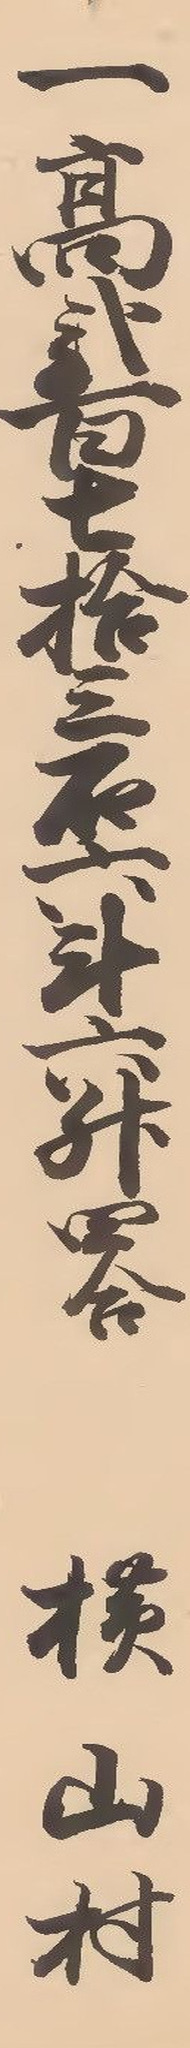一高弐百七拾三石六斗六升四合横山村
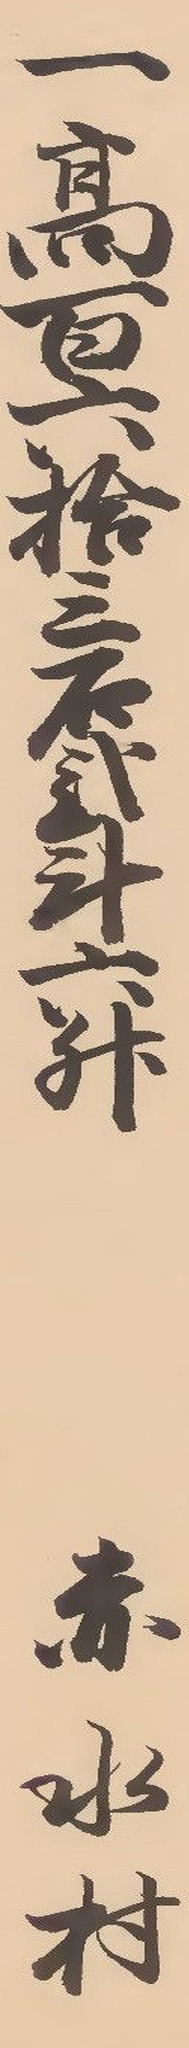一高百六拾三石弐斗六升赤水村
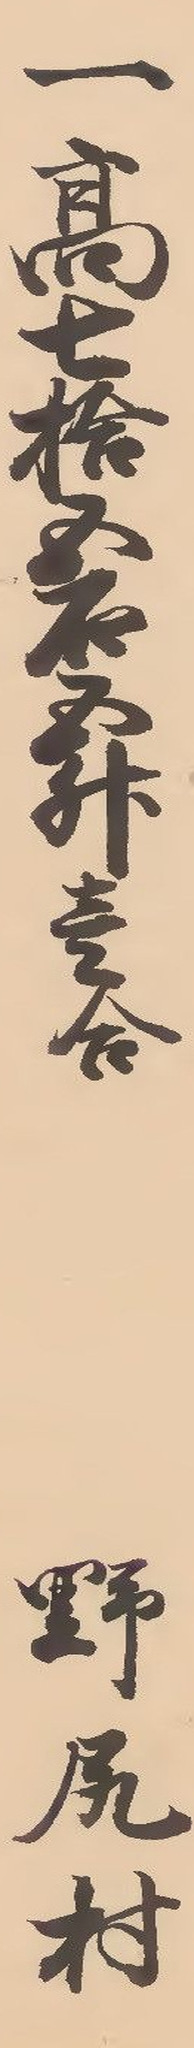一高七拾五石五升壱合野尻村

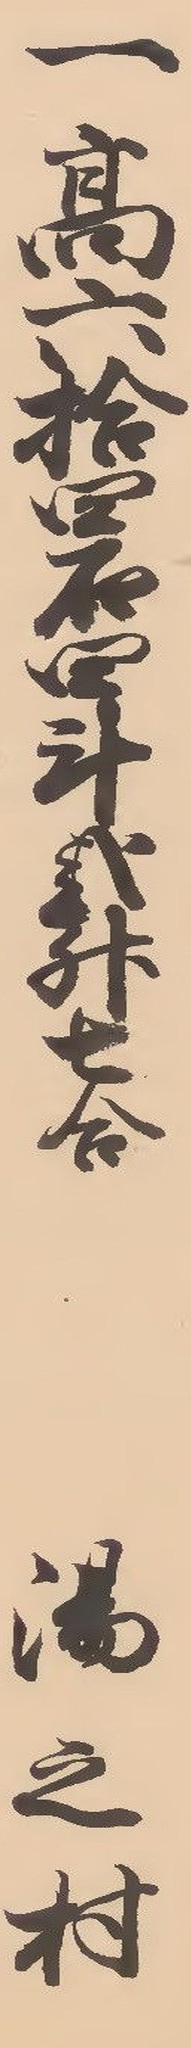一高六拾四石四斗弐升七合湯之村
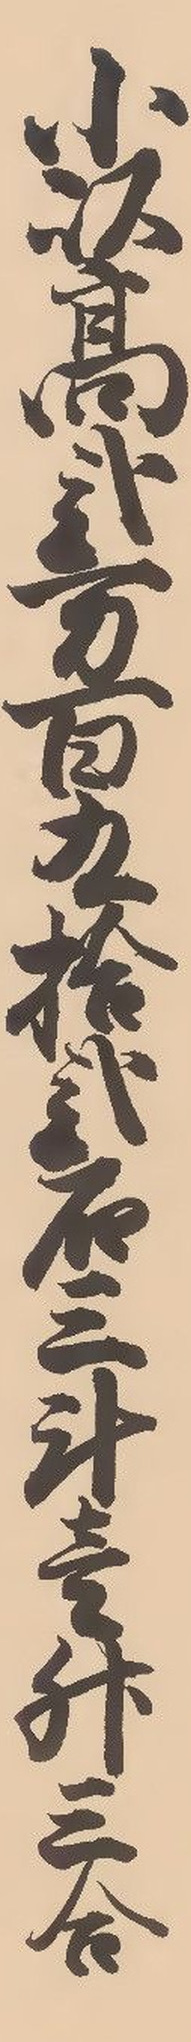小以高弐万百九拾弐石三斗壱升三合
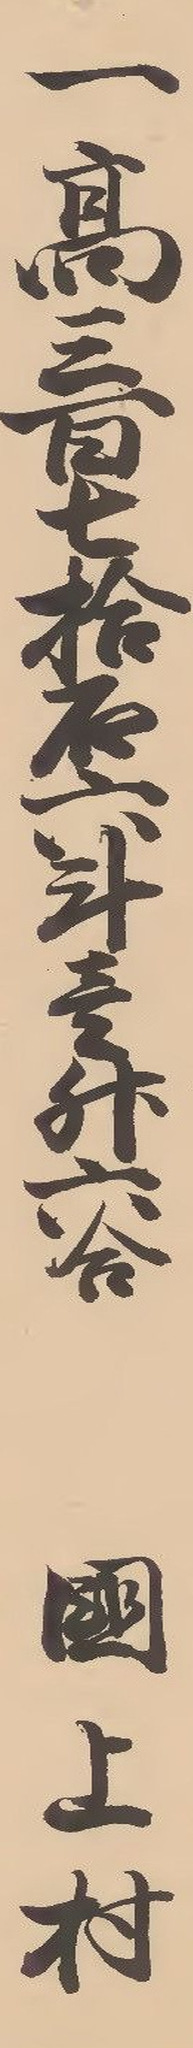一高三百七拾石六斗壱升六合国上村
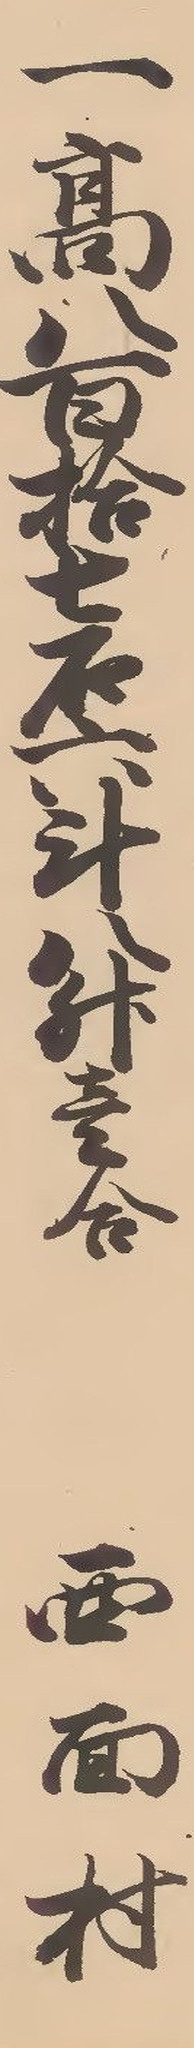一高八百拾七石六斗八升壱合西面村
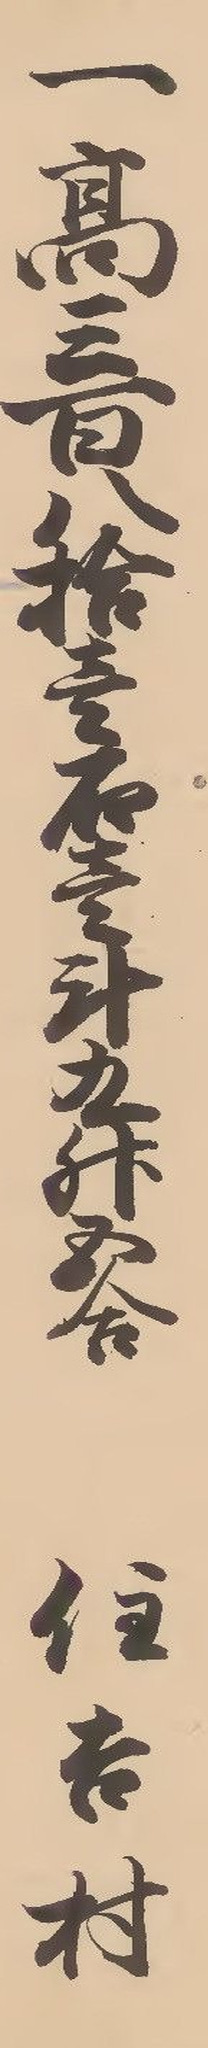一高三百八拾壱石壱斗九升五合住吉村
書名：大隅国郷帳
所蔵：国立公文書館 National Archives of Japan
